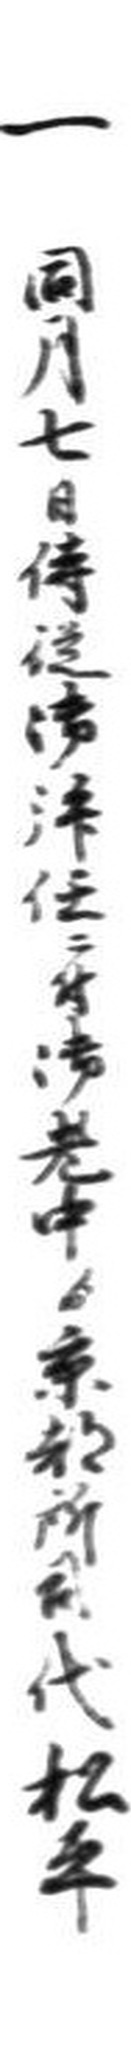一同月七日侍従御拝任ニ付御老中ゟ京都所司代松平
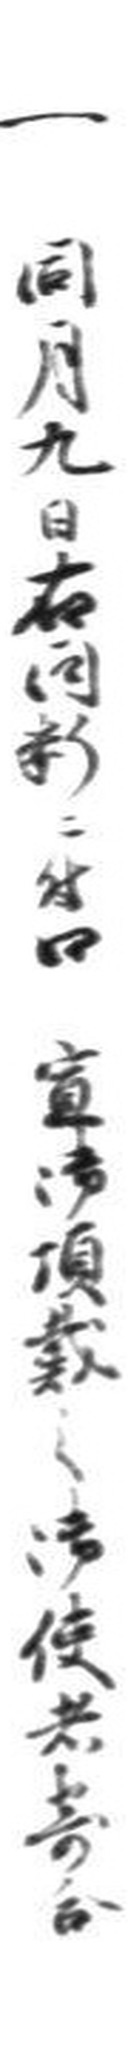一同月九日右同断ニ付口宣御頂戴之御使者寄合

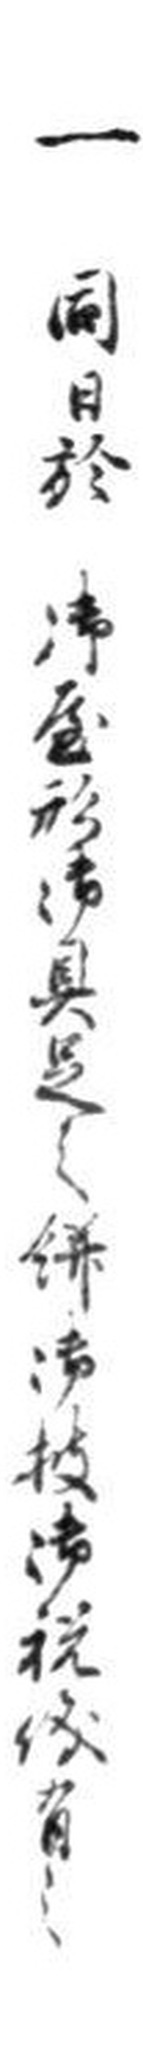一同日於御屋形御具足之餅御披御祝儀有之
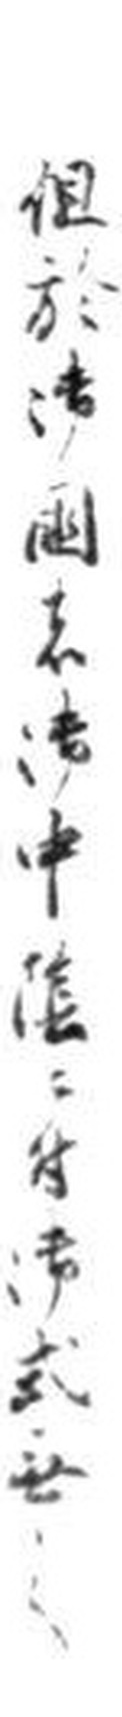但於御国者御中陰ニ付御式無之
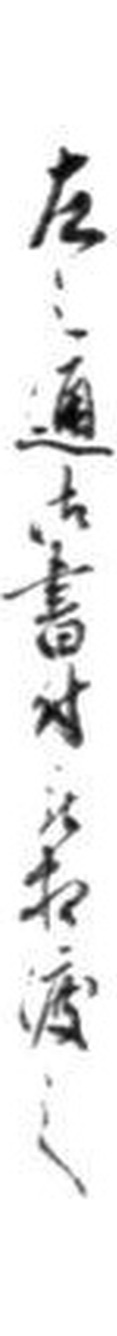左之通御書付被相渡之
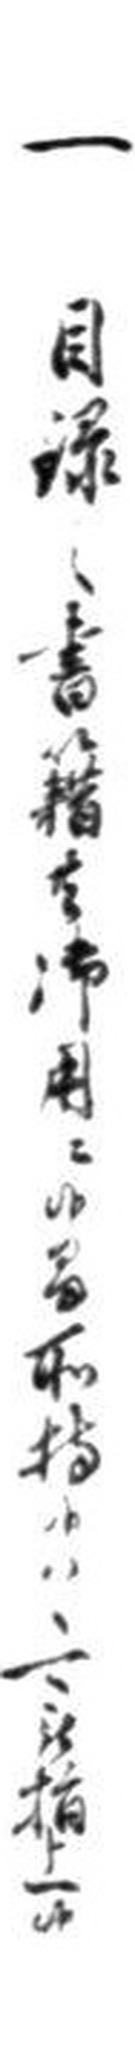一目録之書籍共御用ニ候間所持候ハヽ可被指上候
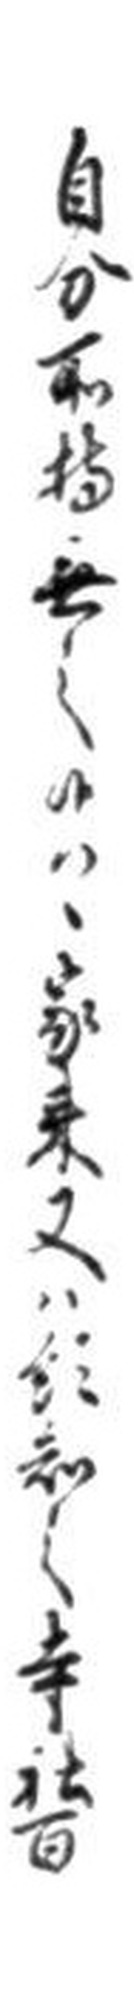自分所持無之候ハヽ家来又ハ領知之寺社百
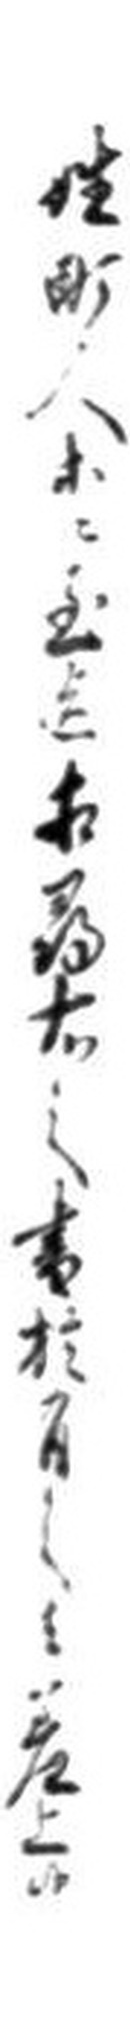姓町人等ニ至迄相尋右之書於有之者差上候
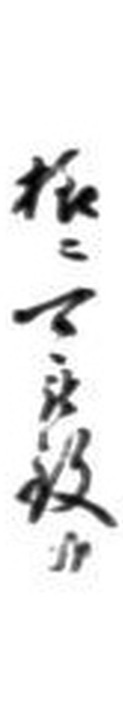様ニ可被致候
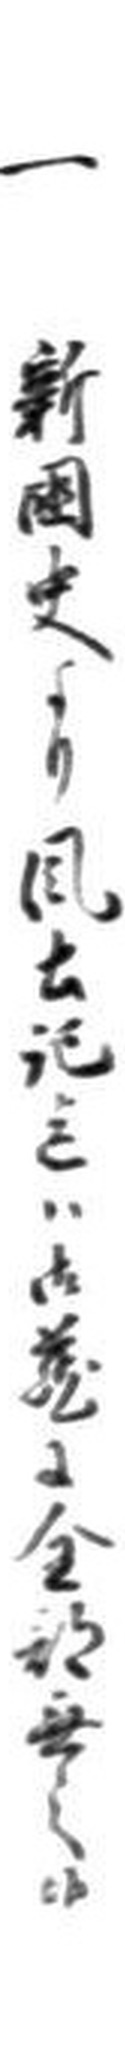一新国史より風土記迄ハ御蔵尓全部無之候
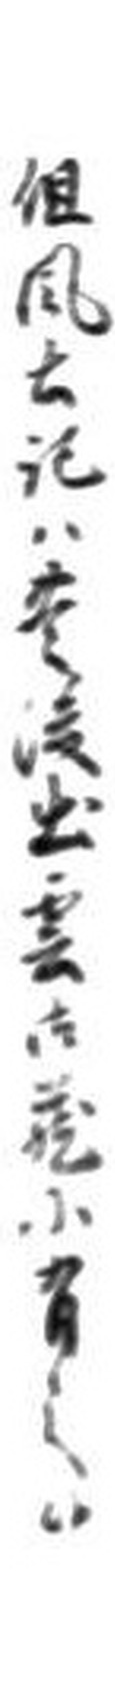但風土記ハ豊後出雲御蔵尓有之候
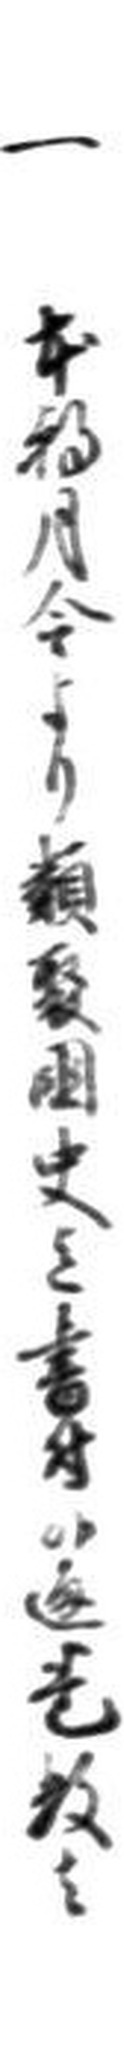一本朝月令より類聚国史迄書付候通巻数者
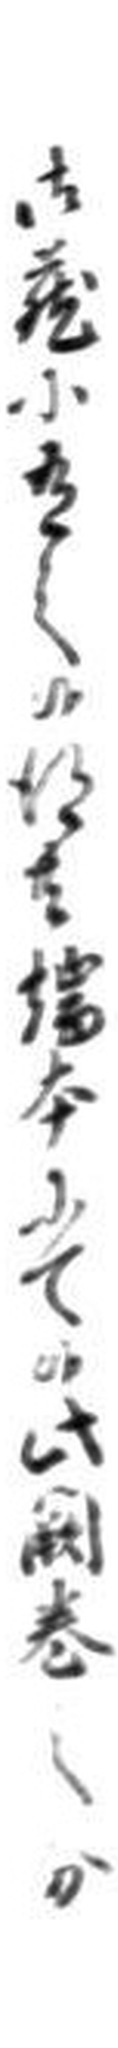御蔵尓有之候得共端本尓て候此闕巻之分
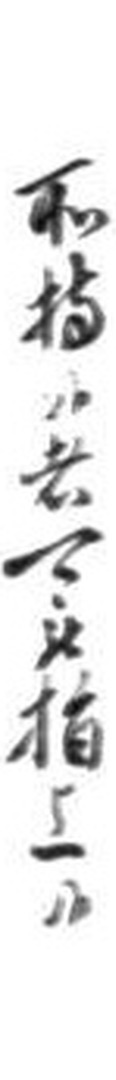所持候者可被指上候
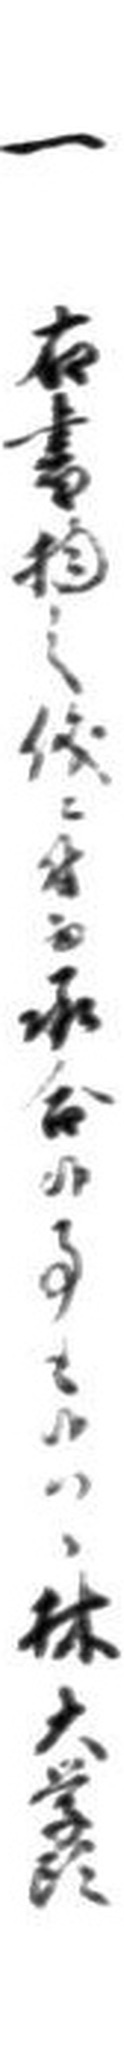一右書物之儀ニ付而承合候事ニ候ハヽ林大学頭
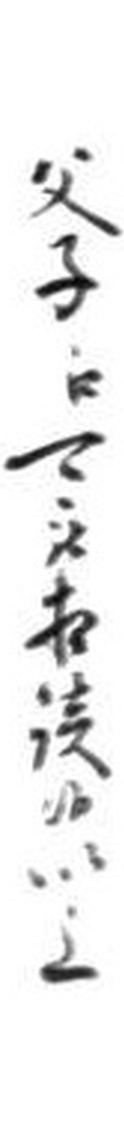父子江可被相談候以上
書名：家譜 三十五 宗昌公 従享保六年到同七年
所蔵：福井県文書館 Fukui Prefectural Archives
